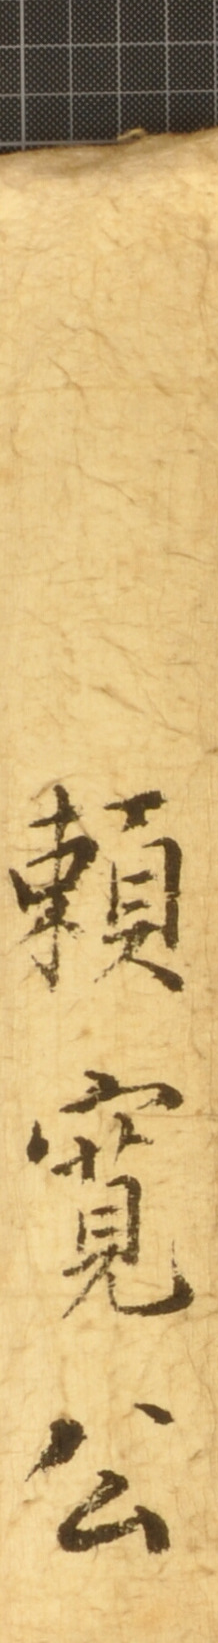頼寛公
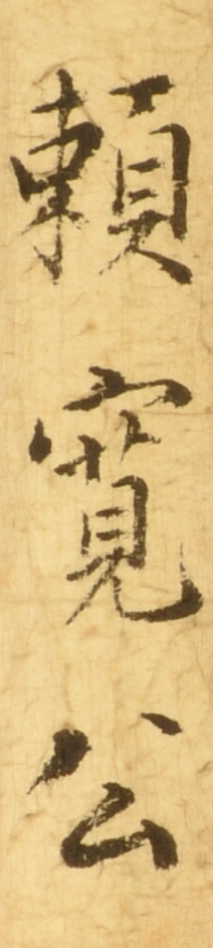頼寛公

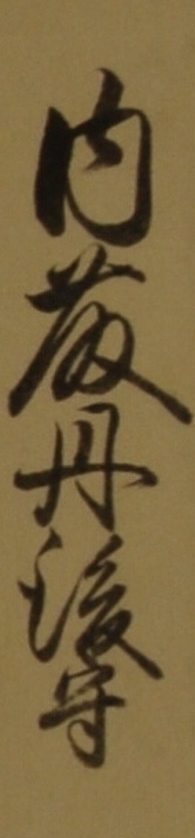内藤丹後守
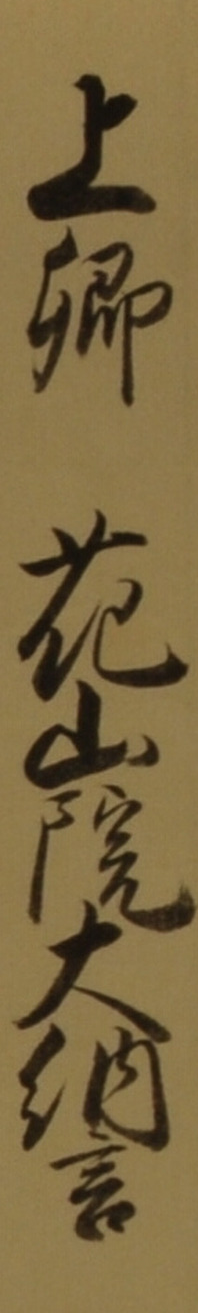上卿花山院大納言
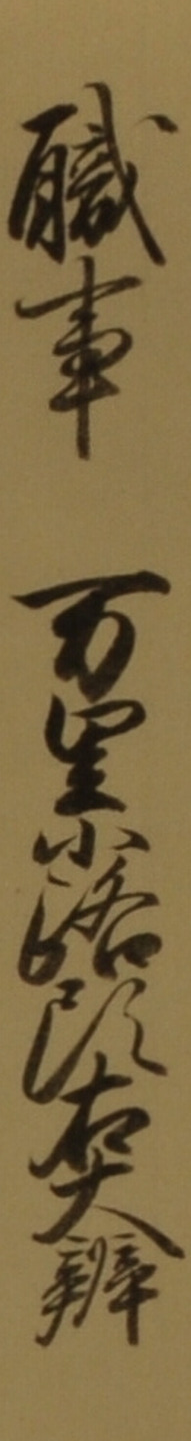職事万里小路頭右大弁

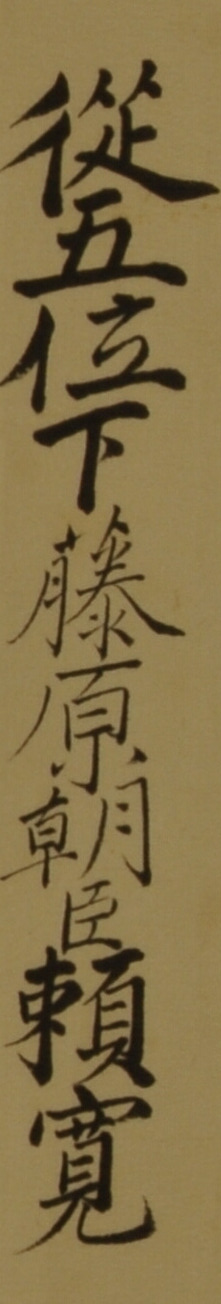従五位下藤原朝臣頼寛
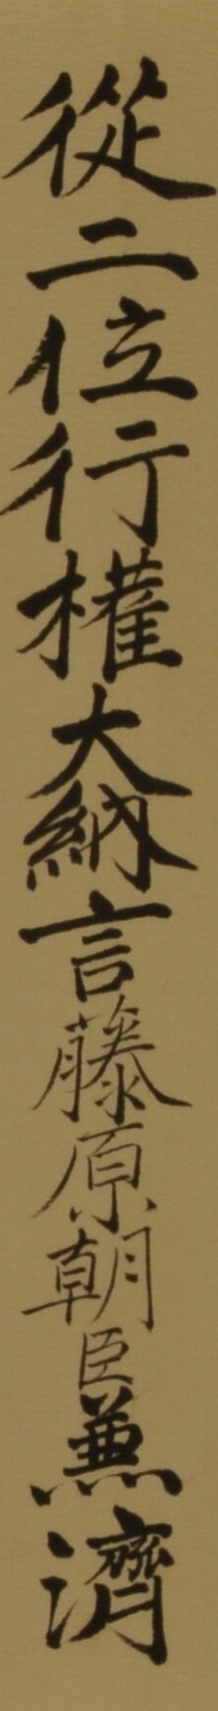従二位行権大納言藤原朝臣兼済
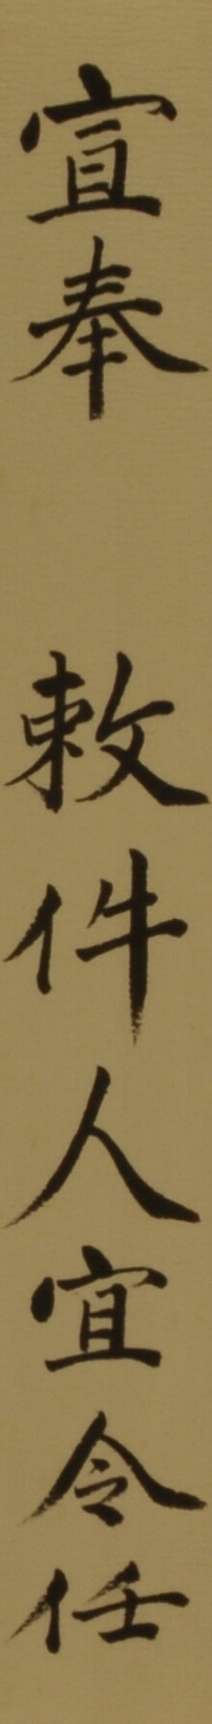宣奉敕件人宜令任
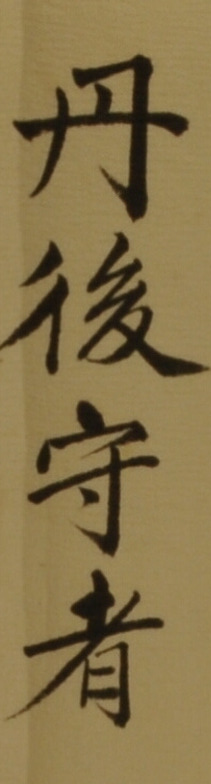丹後守者
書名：口宣案・宣旨・位記
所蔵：伊那市立高遠町図書館・合同会社AMANE
